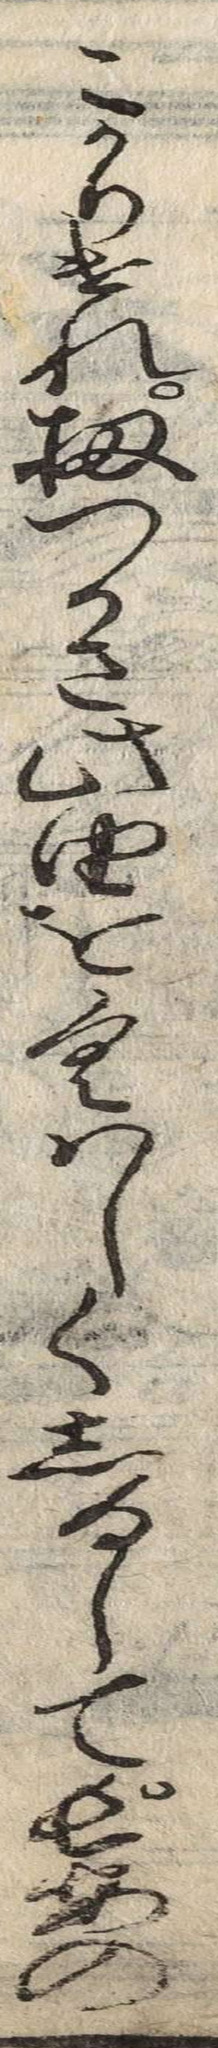こかりけれ。扨つかさ此由をくはしくしるして。長安の
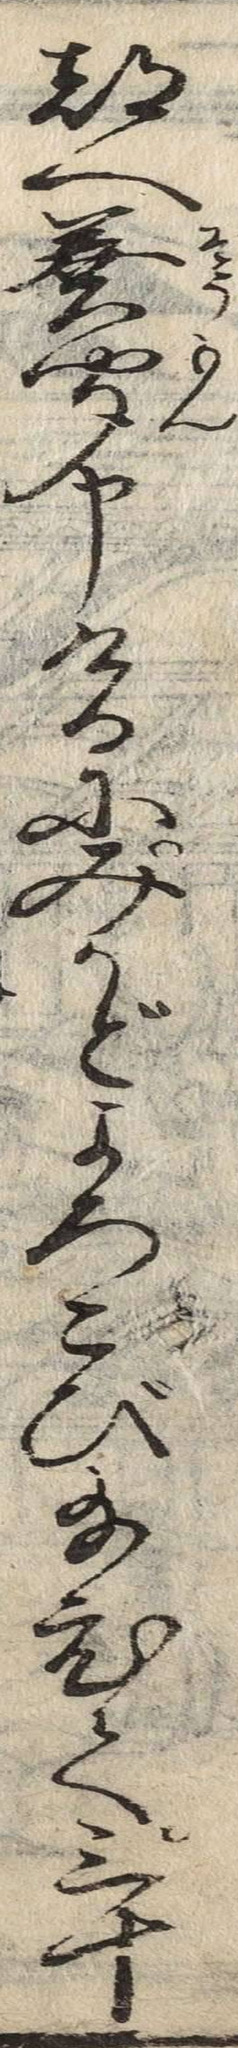都へ奏聞申けるに。みかどよろこび給ひて。三十
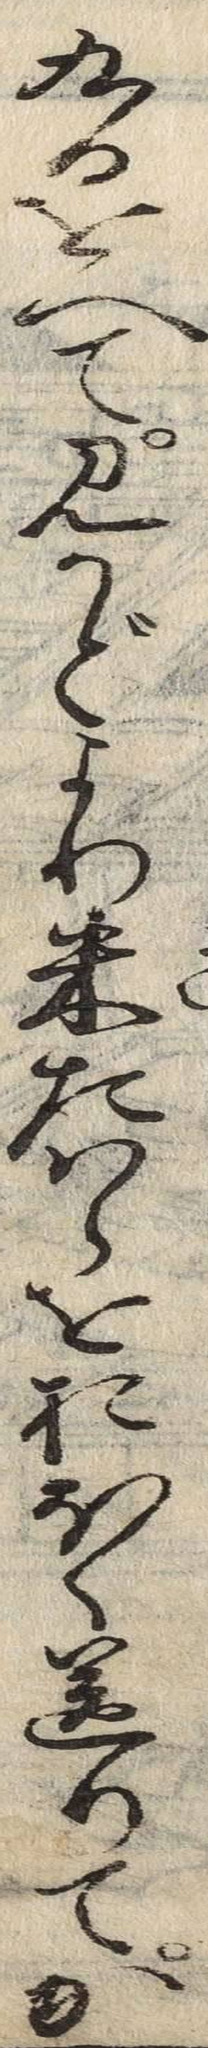九日をへて。みかどより米たはらをおほく送りて。か
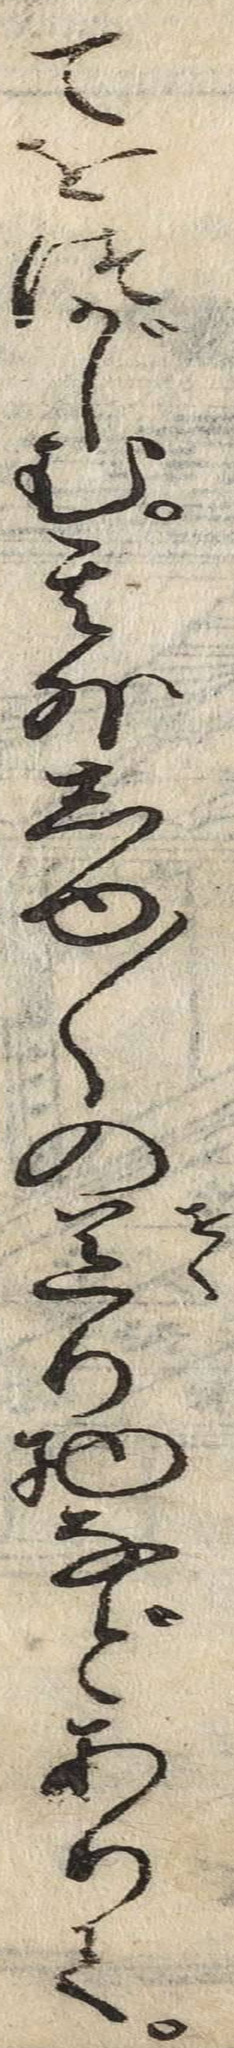てをつがしむ。其外しゆ〳〵の送り物などありて。
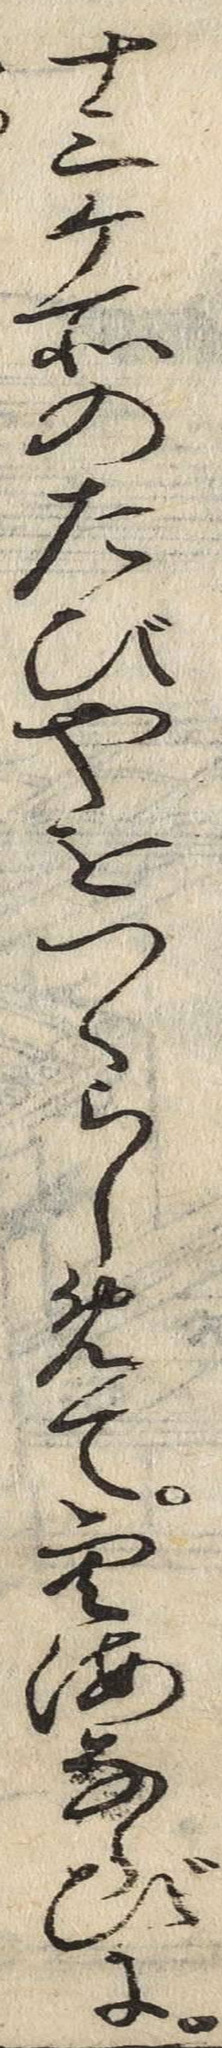十三ヶ所のたびやをつくらしめて。空海ならびに。
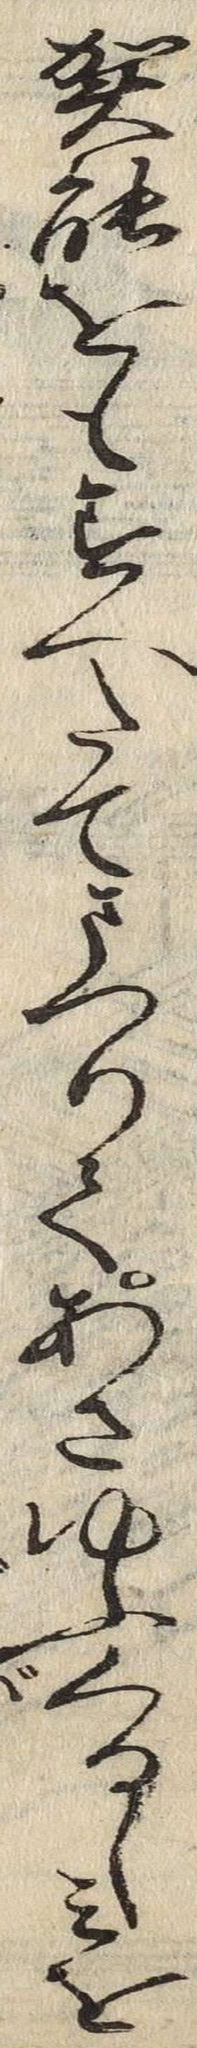賀能をもすへたてまつりて。あさゆふくるしみを
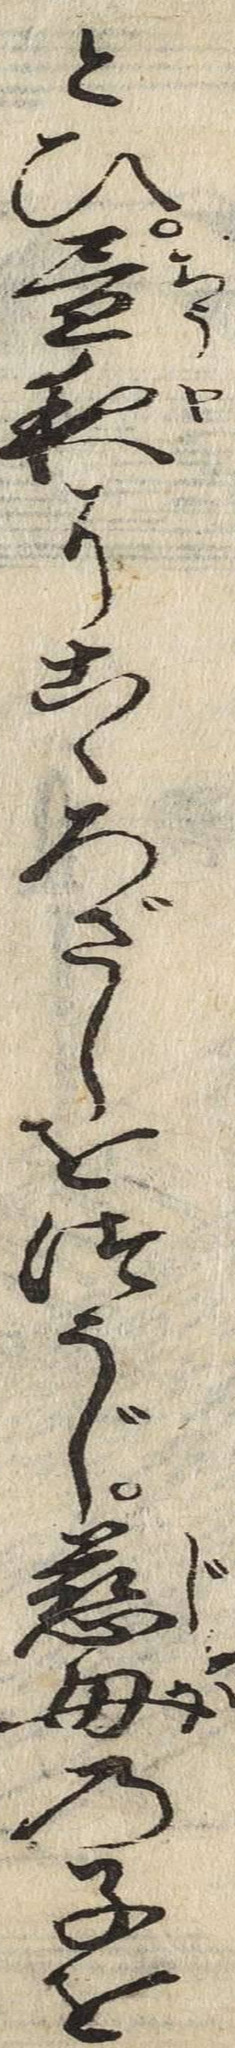とひ。昼夜にこゝろざしをつうじ。慈母の子を
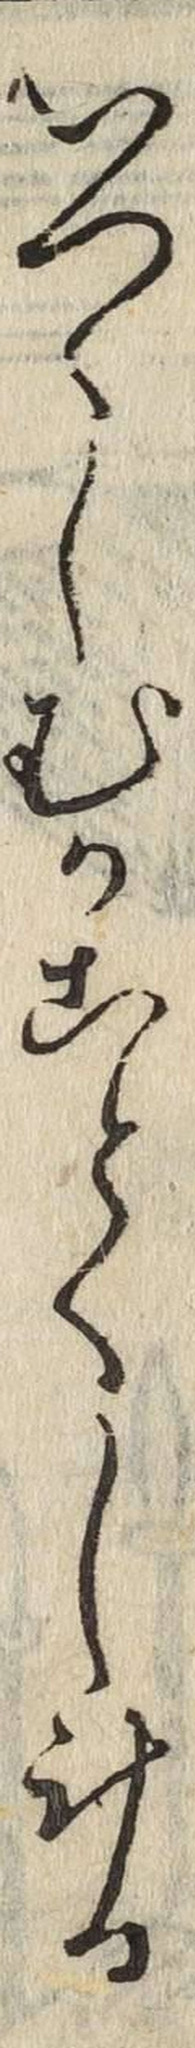いつくしむかことくしける

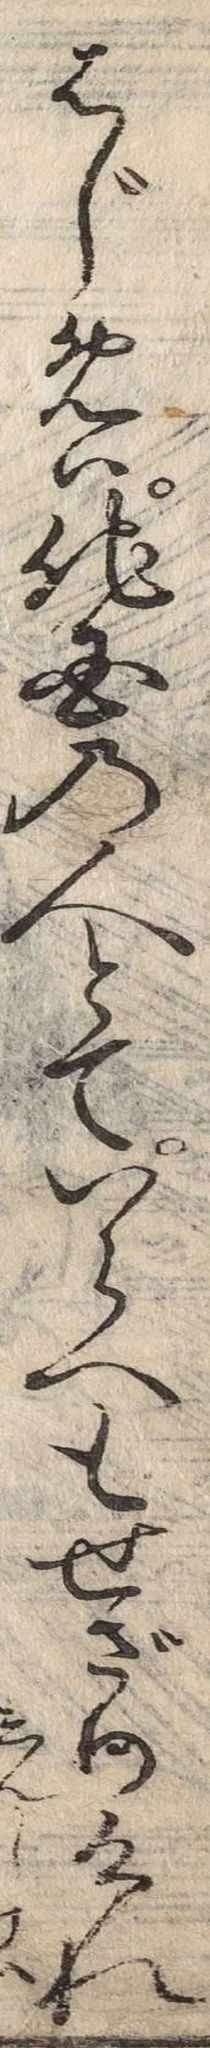はじめは。他国の人とて。いらへもせざりけれ
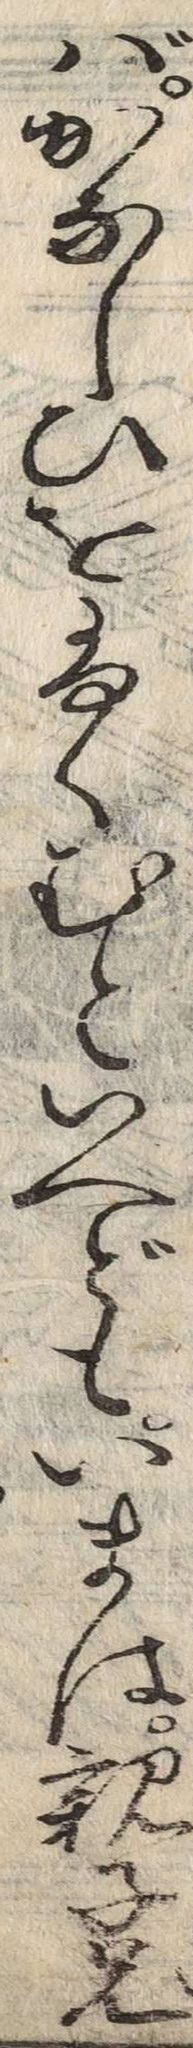ば。かなしひをふくむといへども。いまは。親子兄
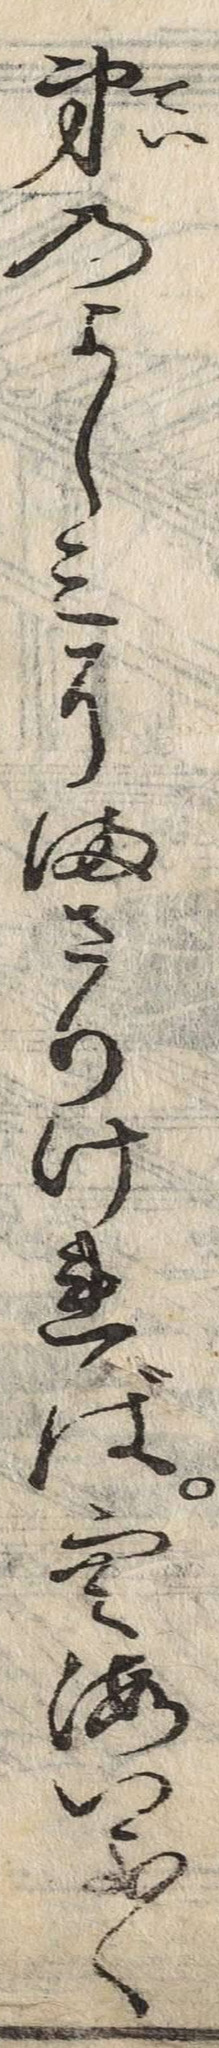弟のよしみにまさりければ。空海いよ〳〵
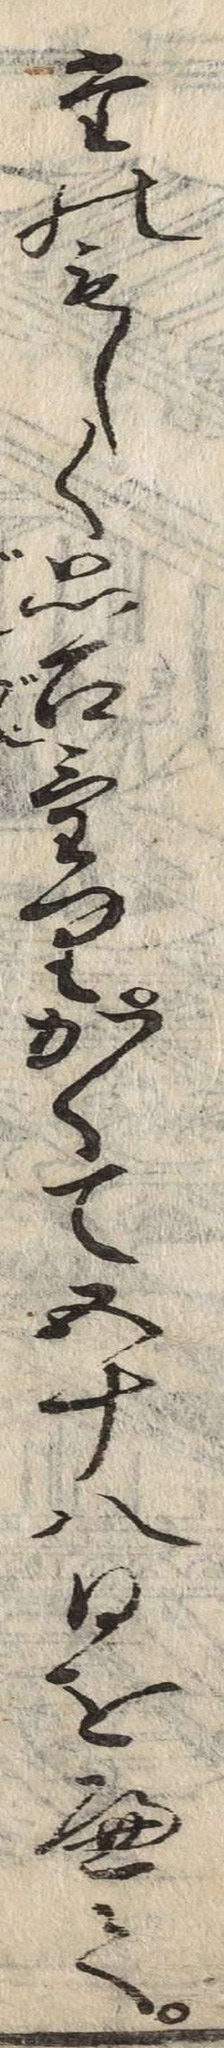たのもしく思召たり。かくて五十八日をへて。
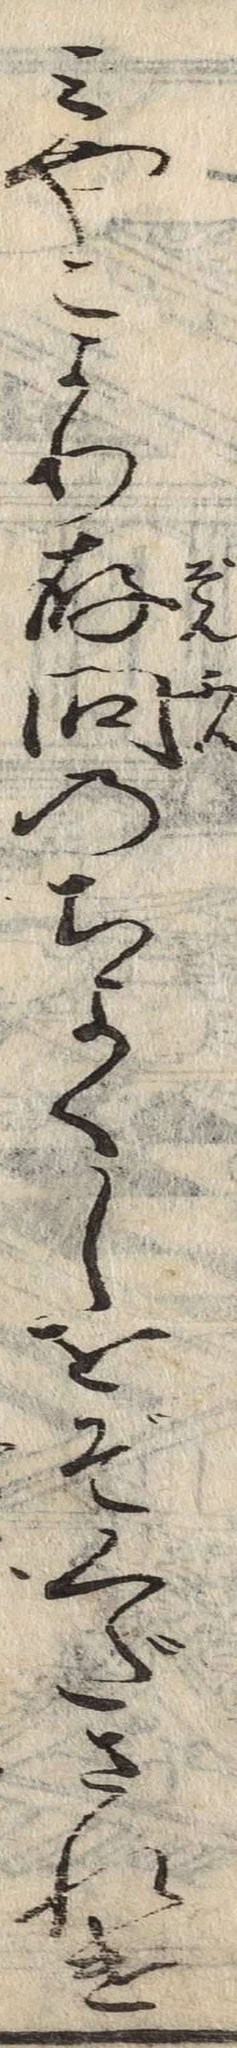みやこより存問のちよくしをぞくだされ
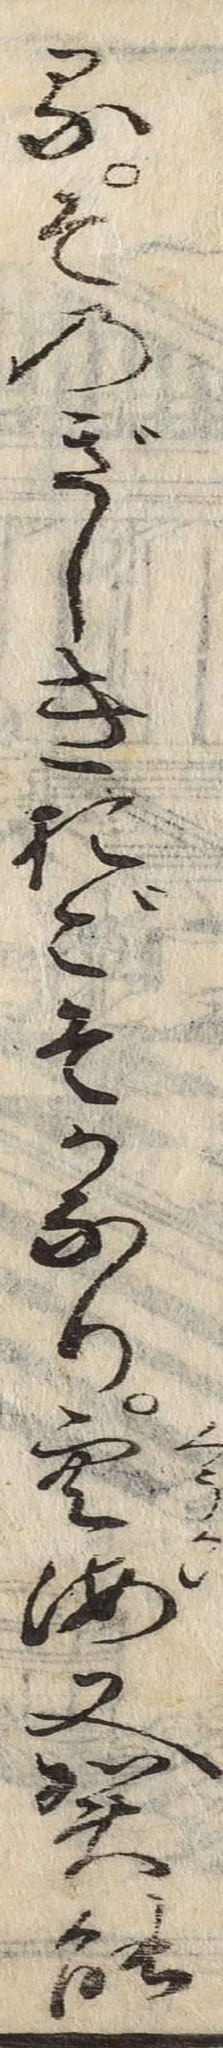る。そのぎしきおごそかなり。空海又賀能
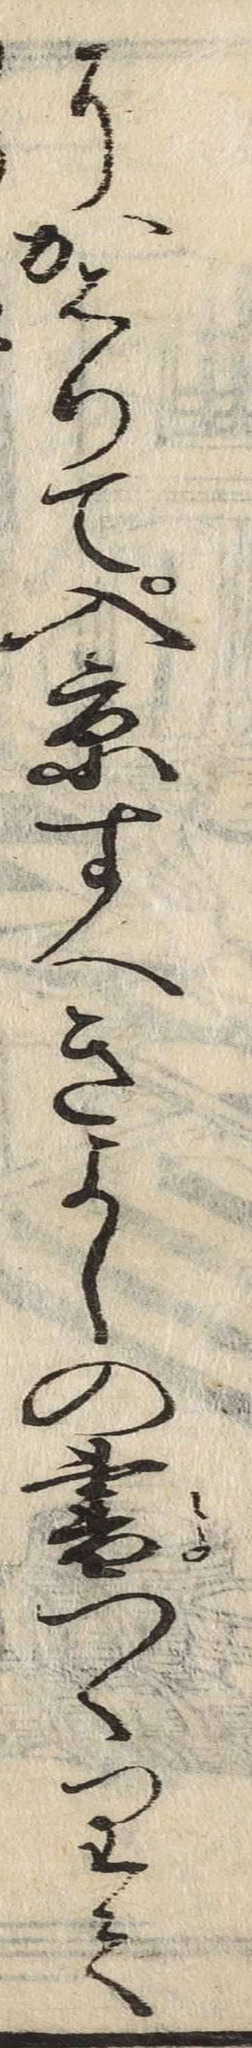にかはりて。入京すへきよしの書つくりて
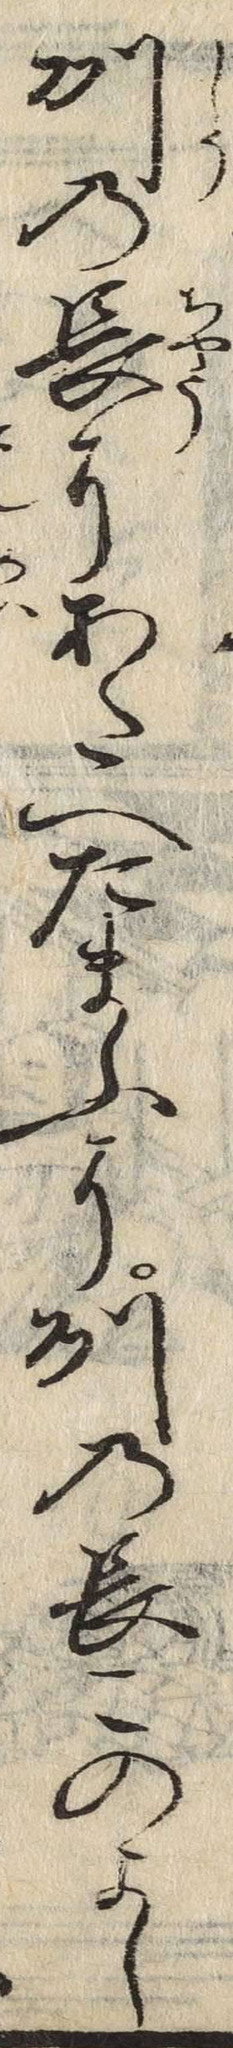州の長にあたへたまふに。州の長このよし
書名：弘法大師御傳記
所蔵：京都府立京都学・歴彩館 国文学研究資料館
